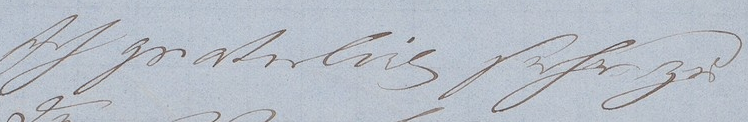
Ich gratulire sehr zu
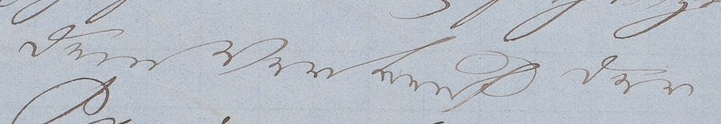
dem Verkauf der
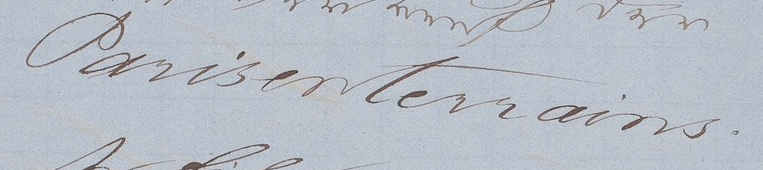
Pariserterrains.
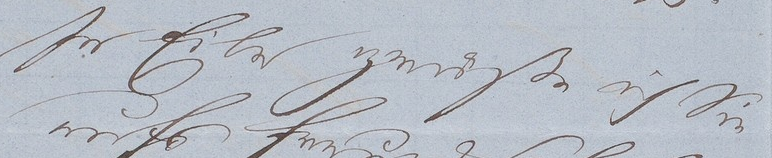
In Eile grüße ich Sie
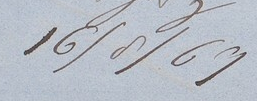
16/5/67
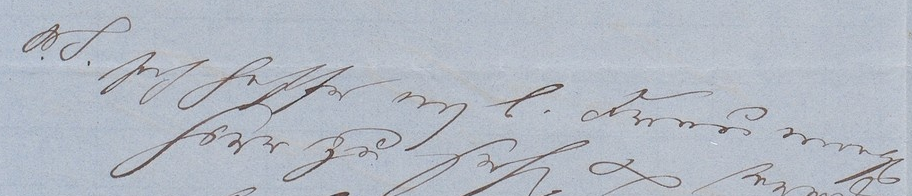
P.S. Ich hoffe meine l. Fraumorgen
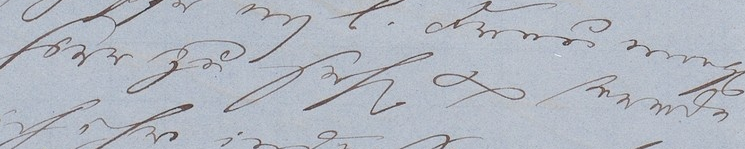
hier zu sehen & werde
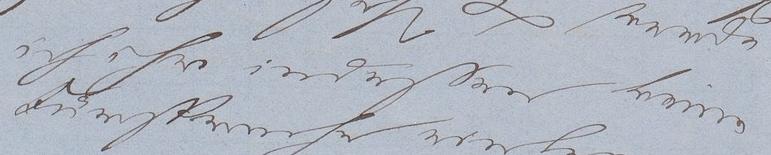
ich ihr indessen keine
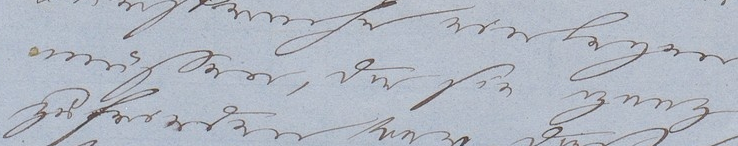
müssen, da sie ganz
